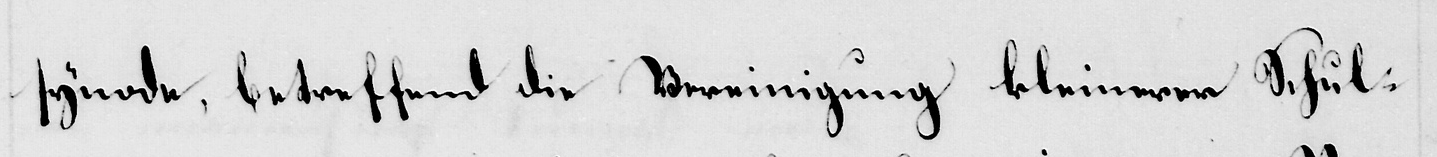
node, betreffend die Vereinigung kleinerer Schul¬
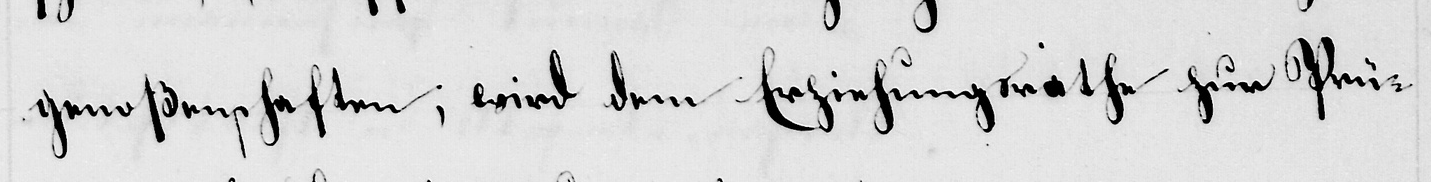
genoßenschaften, wird dem Erziehungsrathe zur Prü¬
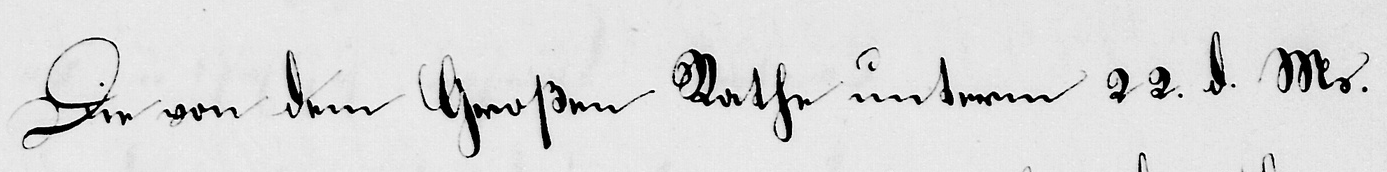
Die von dem Großen Rathe unterm 22. d. Ms.
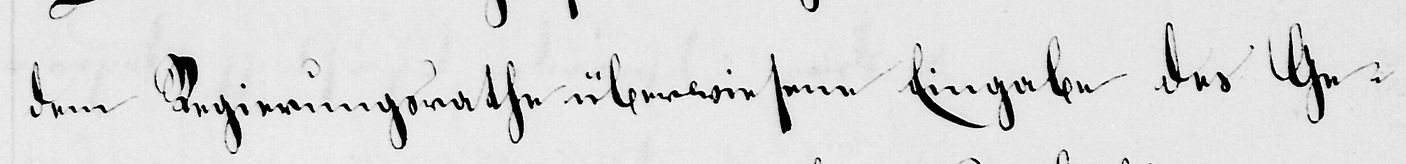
dem Regierungsrathe überwiesene Eingabe des Ge¬
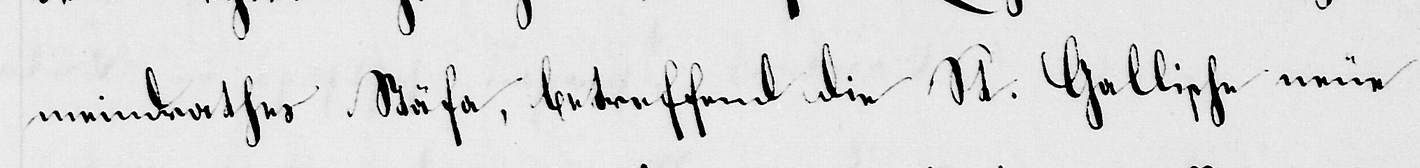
meindrathes Stäfa, betreffend die St. Gallische neue
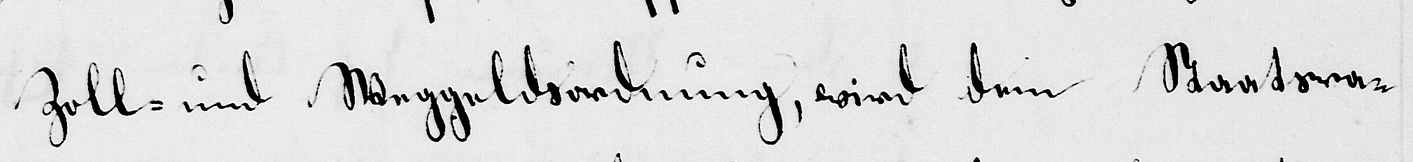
Zoll- und Weggeldsordnung, wird dem Staatsra¬
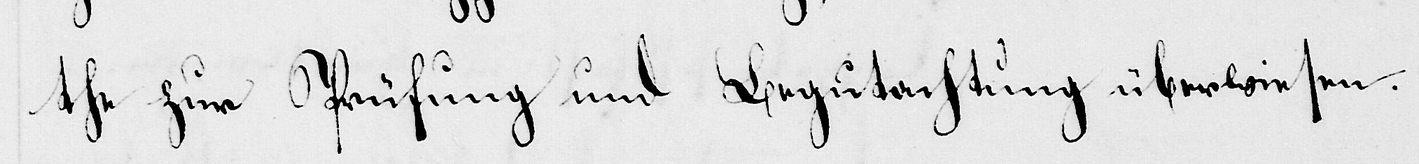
the zur Prüfung und Begutachtung überwiesen.
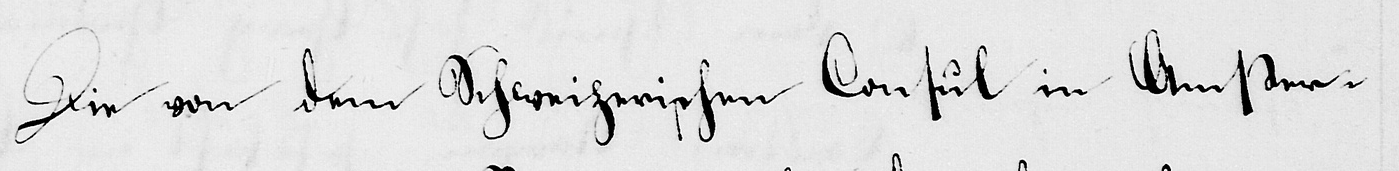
Die von dem Schweizerischen Consul in Amster¬
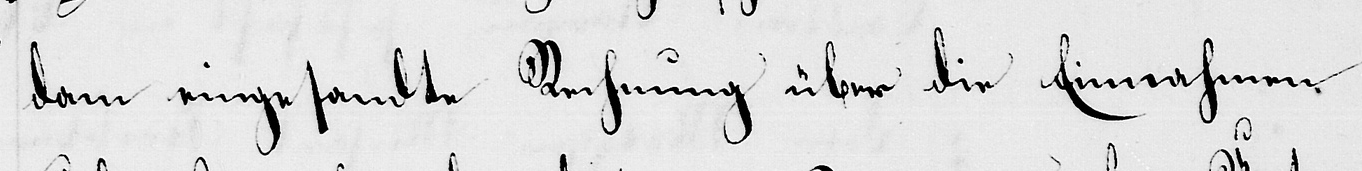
dam eingesandte Rechnung über die Einnahmen
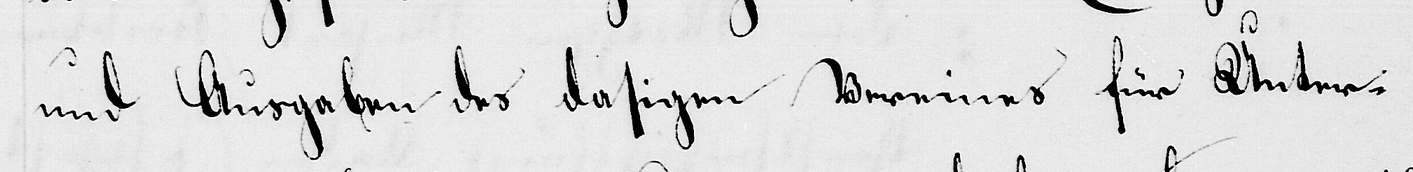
und Ausgaben des dasigen Vereines für Unter¬
